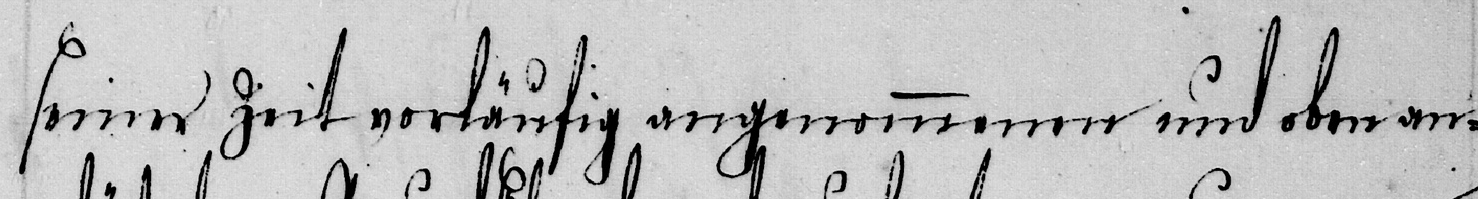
seiner Zeit vorläufig angenommenen und oben an¬
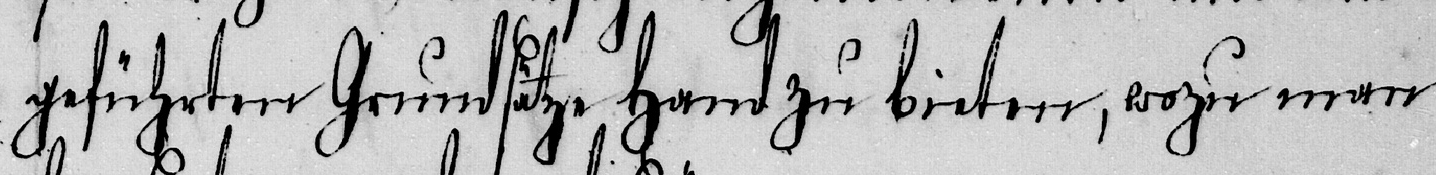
geführten Grundsätze Hand zu bieten, wozu man
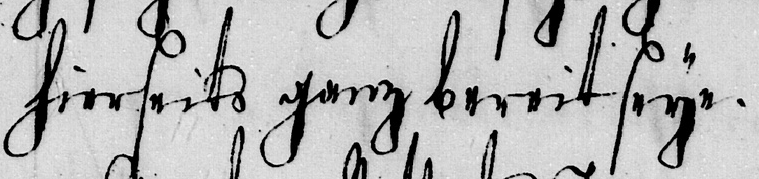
hierseits ganz bereyt seye.
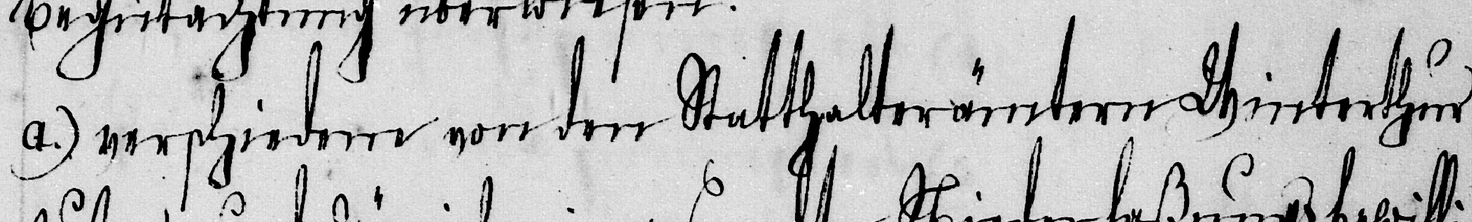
a.) verschiedene von den Statthalterämtern Winterthur,
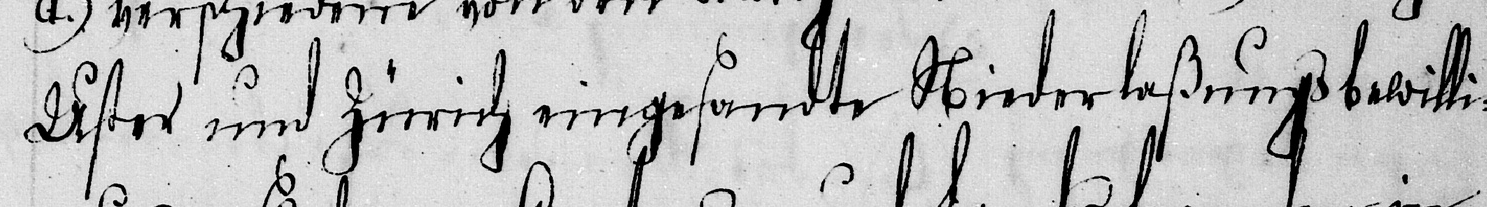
Uster und Zürich eingesandte Niederlaßungsbewill¬
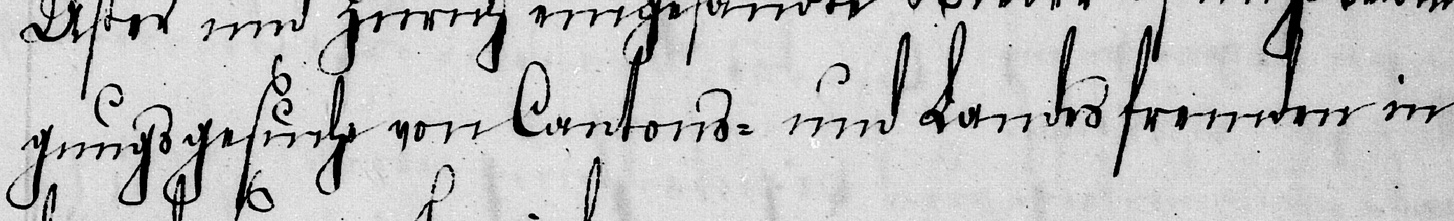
igungsgesuche von Cantons- und Landesfremden in
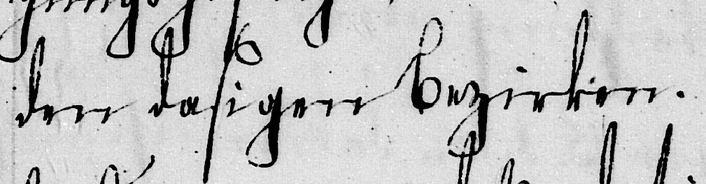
den dasigen Bezirken.
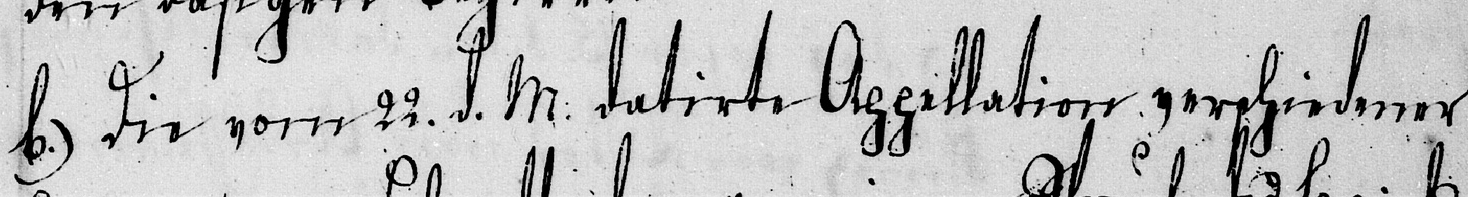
b.) Die vom 22. d. M. datirte Appellation verschiedener
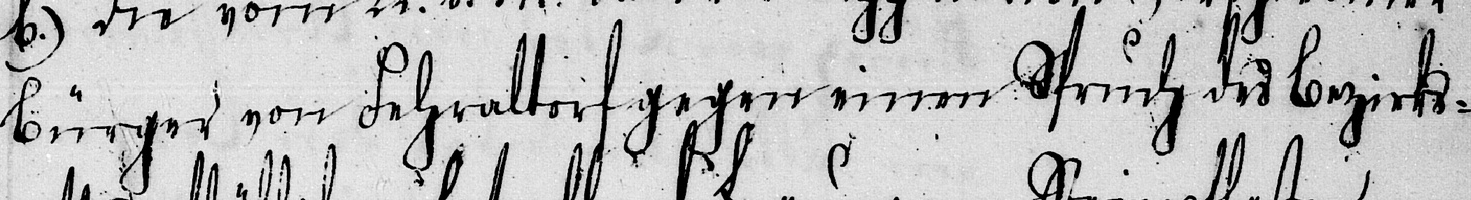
Bürger von Fehraltorf gegen einen Spruch des Bezirks¬
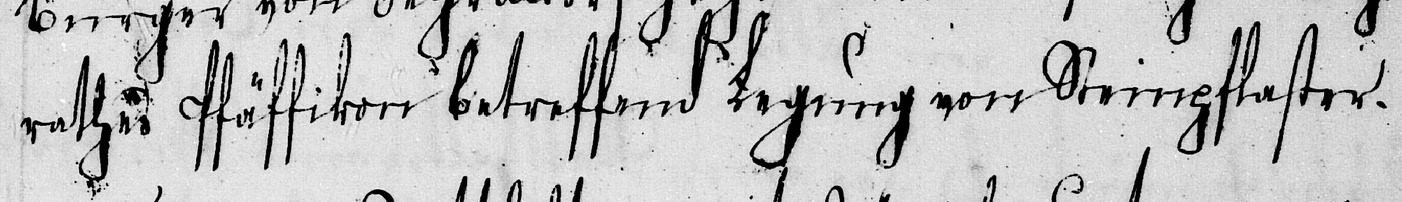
rathes Pfäffikon betreffend Legung von Steinpflaster.
